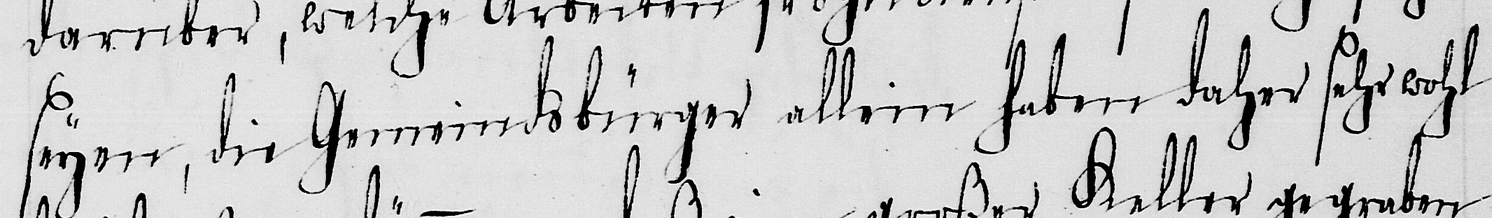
seyen, die Gemeindsbürger allein haben daher sehr wohl
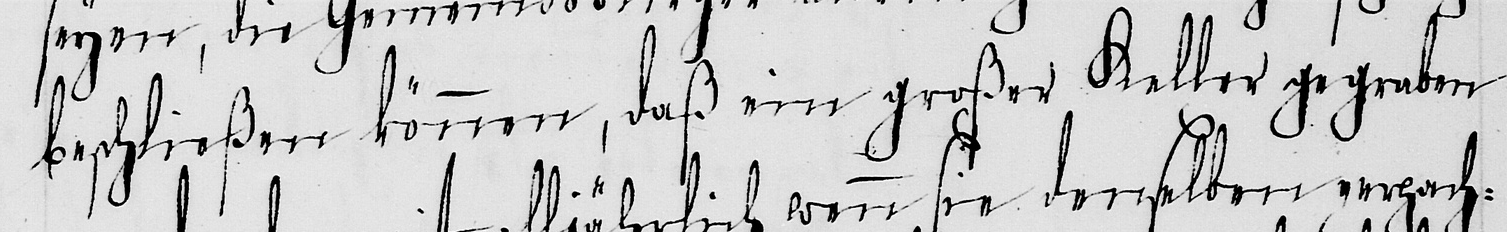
beschließen können, daß ein großer Keller gegraben
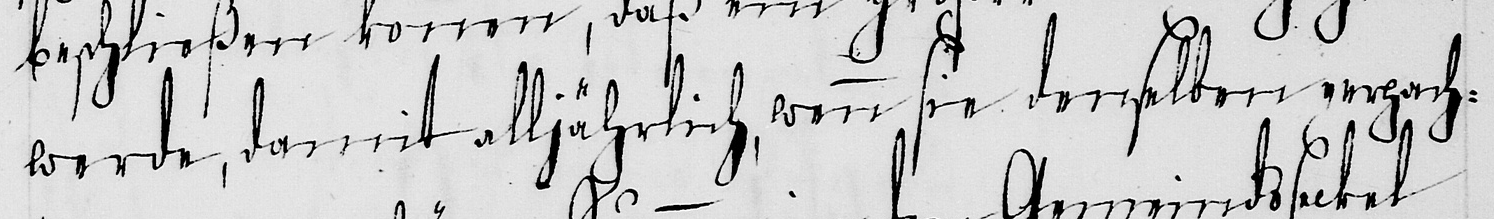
werde, damit alljährlich, wenn sie denselben verpach¬
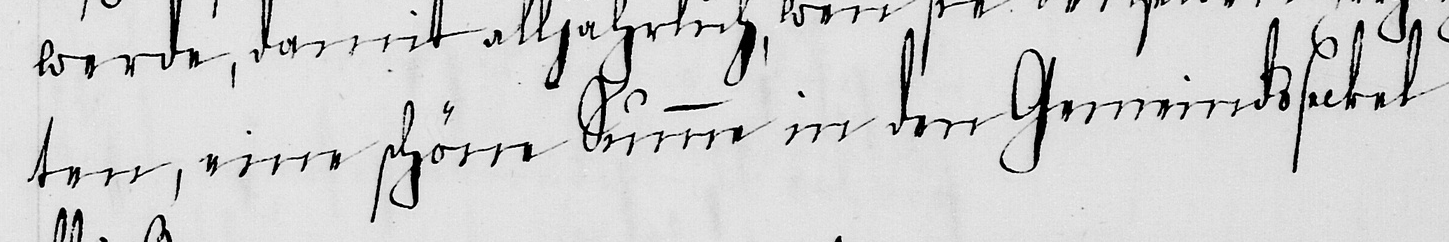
ten, eine schöne Summe in den Gemeindsseckel
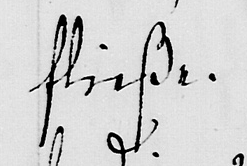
fließe.
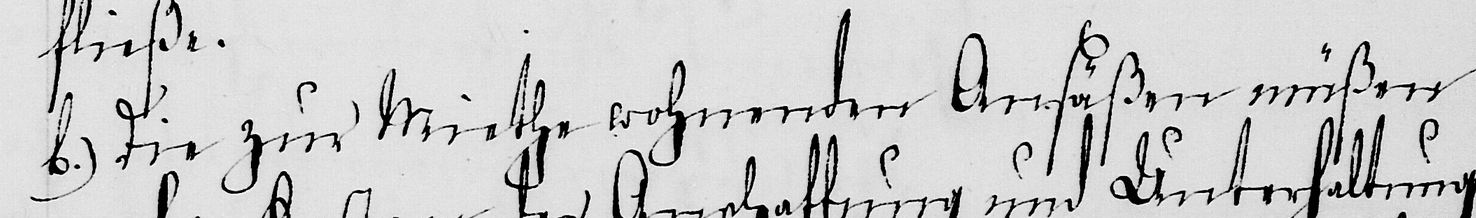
b.) Die zur Miethe wohnenden Ansäßen müßen
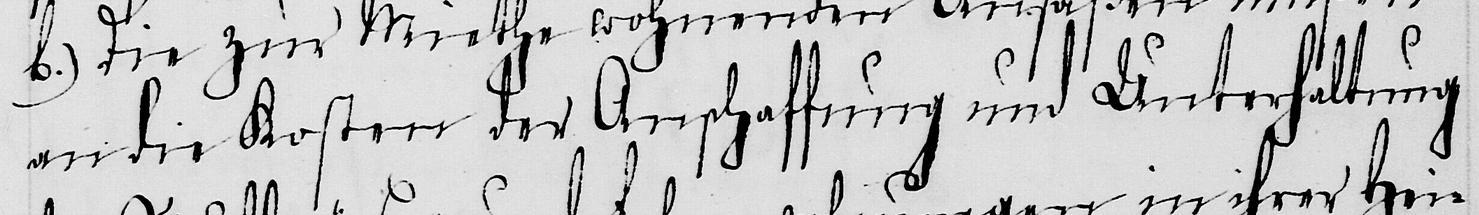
an die Kosten der Anschaffung und Unterhaltung
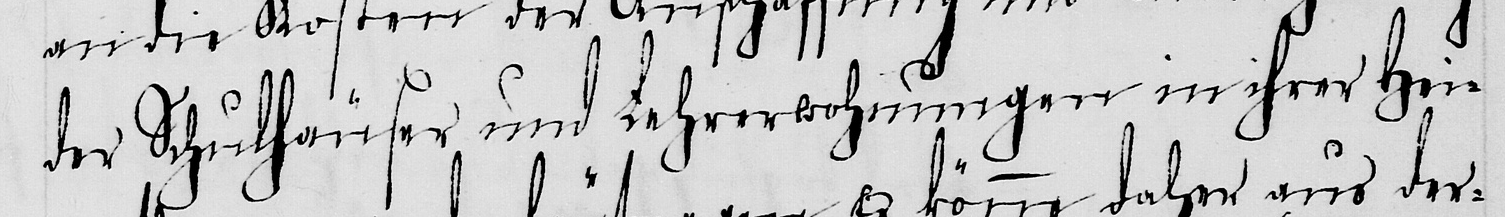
der Schulhäuser und Lehrerwohnungen in ihrer Hei¬
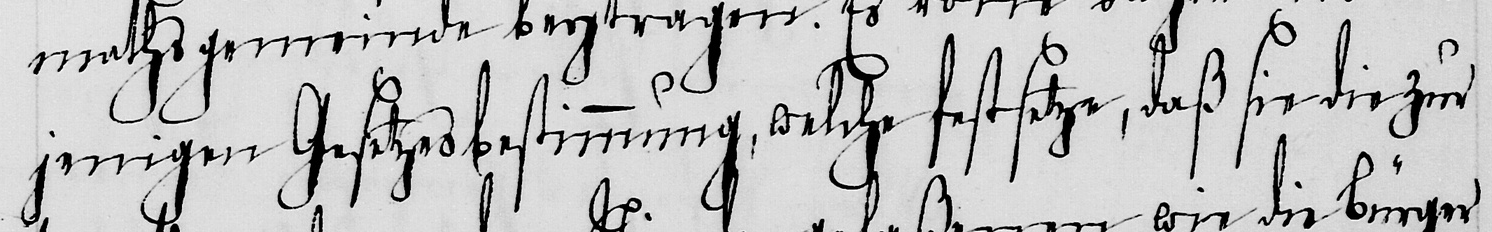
jenigen Gesetzesbestimmung, welche festsetze, daß sie
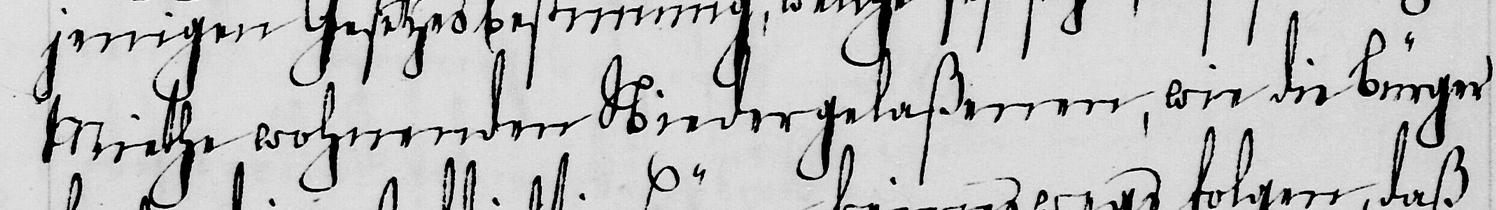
Miethe wohnenden Niedergelaßenen, wie die Bürger
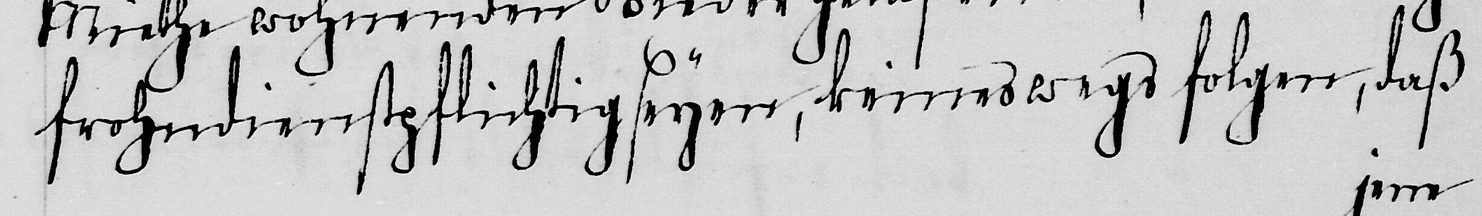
frohndienstpflichtig seyen, keineswegs folgen, daß
